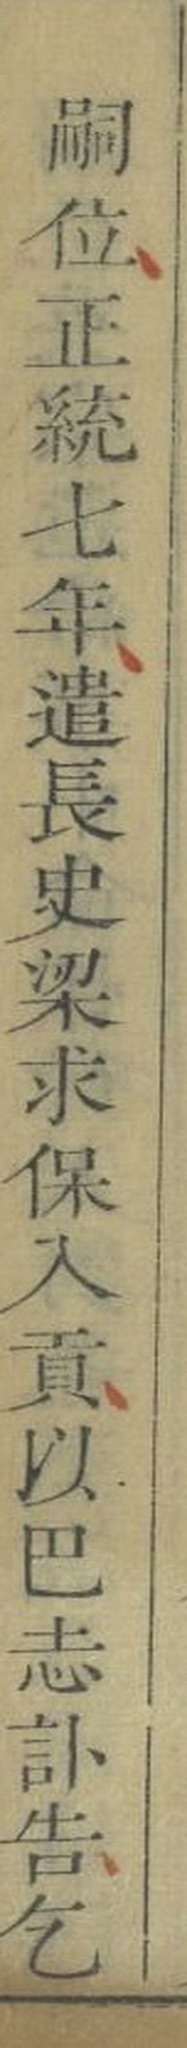嗣位正統七年遣長史梁求保入貢以巴志訃告乞

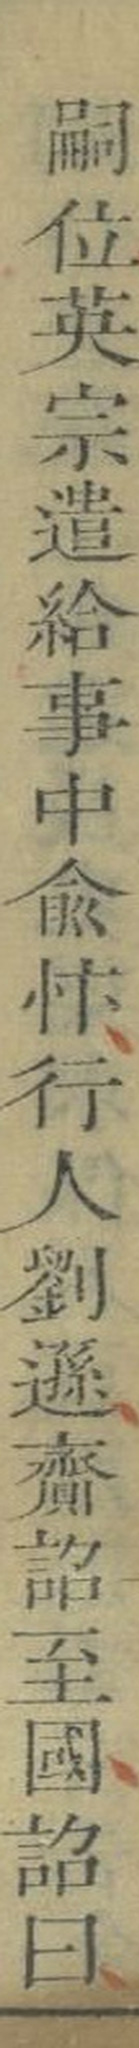嗣位英宗遣給事中兪忭行人劉遜齎詔至国詔曰
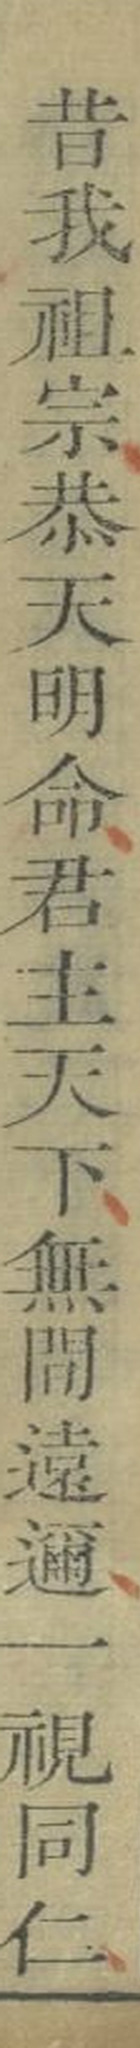昔我祖宗恭天明命君主天下無間遠邇一視同仁
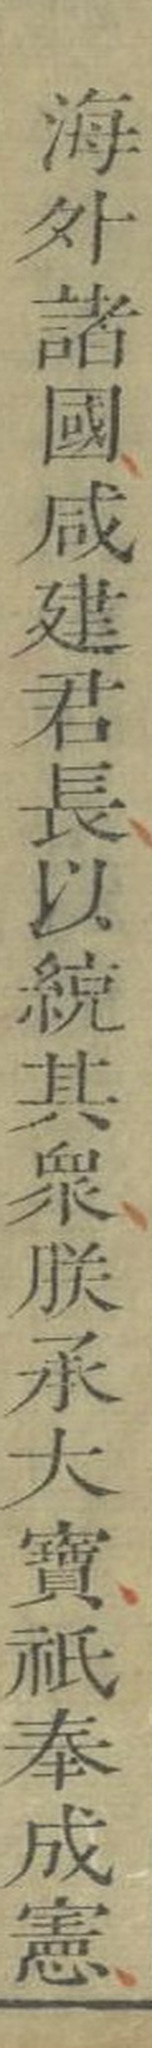海外諸国咸建君長以統其衆朕承大宝祇奉成憲
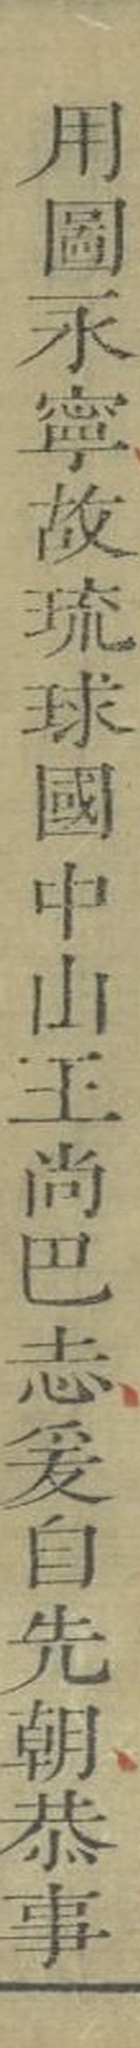用図永寧故琉球国中山王尚巴志爰自先朝恭事
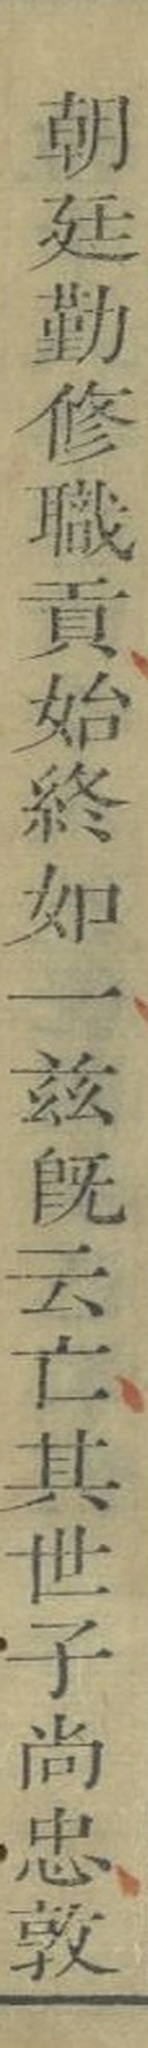朝廷勤修職貢始終如一茲既云亡其世子尚忠敦
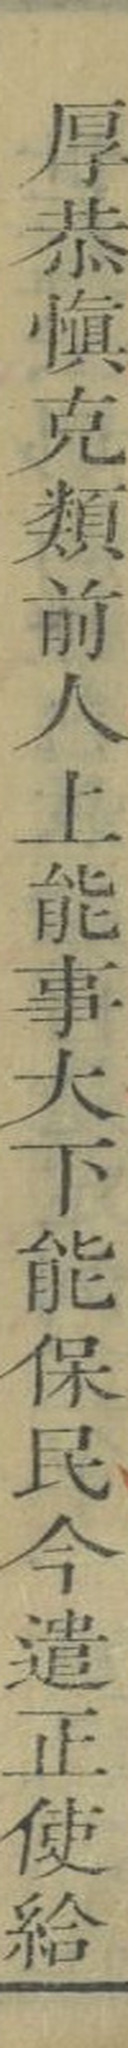厚恭慎克類前人上能事大下能保民今遣正使給
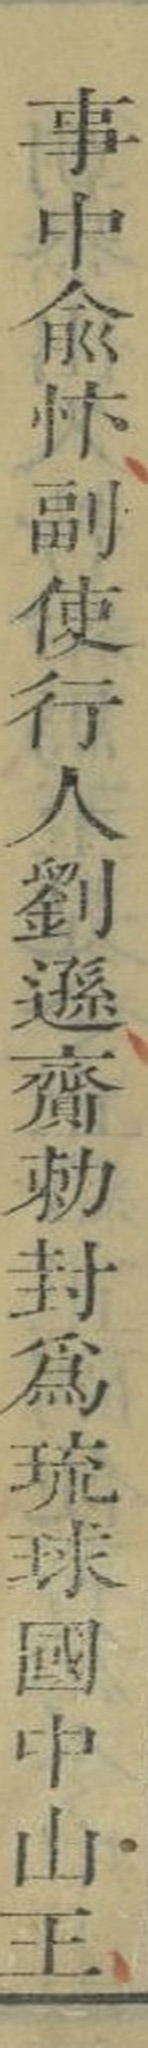事中兪忭副使行人劉遜齎勅封為琉球国中山王
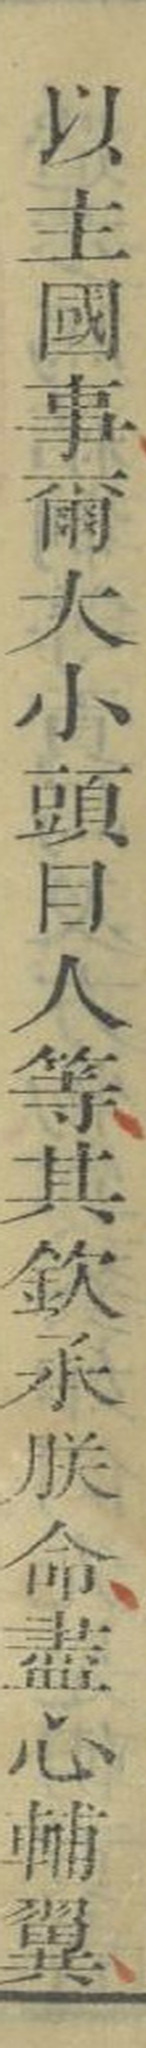以主国事爾大小頭目人等其欽承朕命尽心輔翼
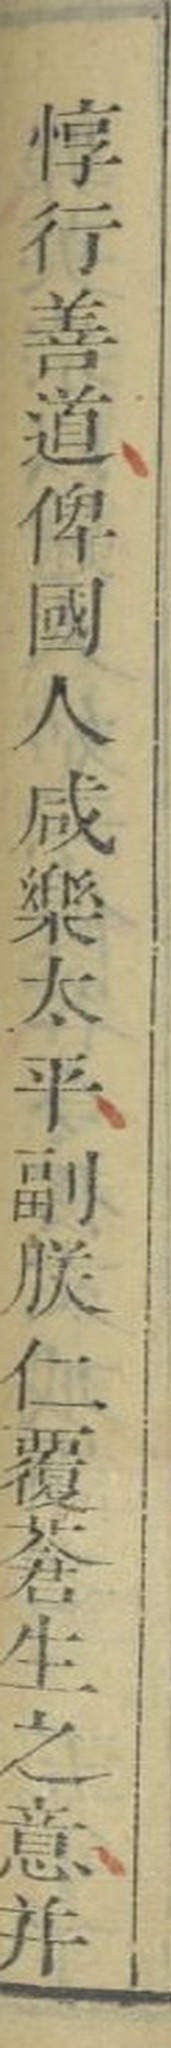惇行善道俾国人咸楽太平副朕仁覆蒼生之意并
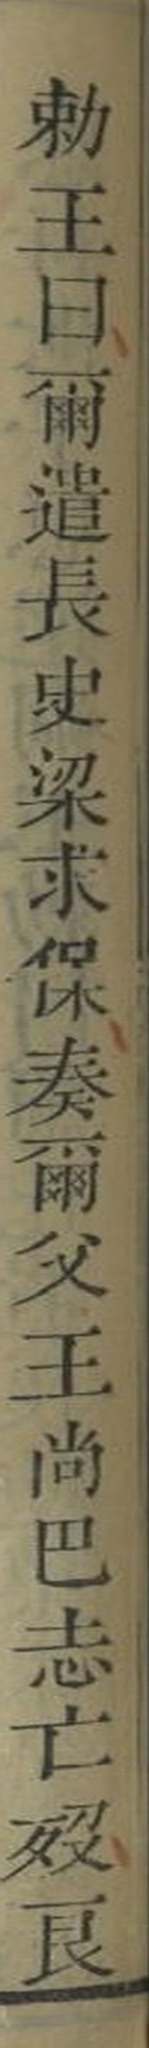勅王曰爾遣長史梁求保奏爾父王尚巴志亡歿良
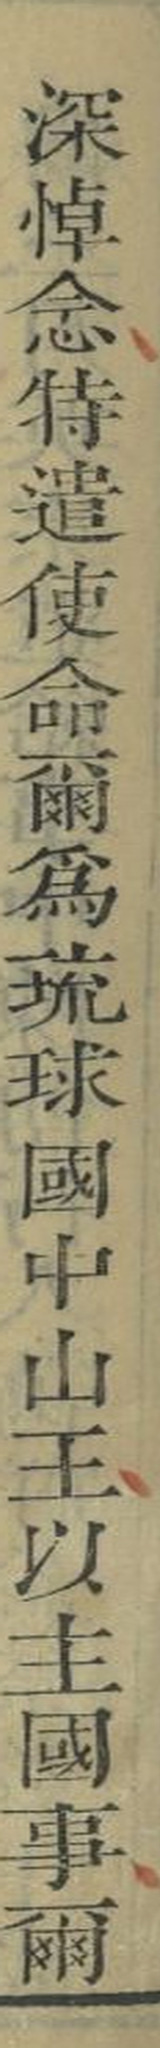深悼念特遣使命爾為琉球国中山王以主国事爾
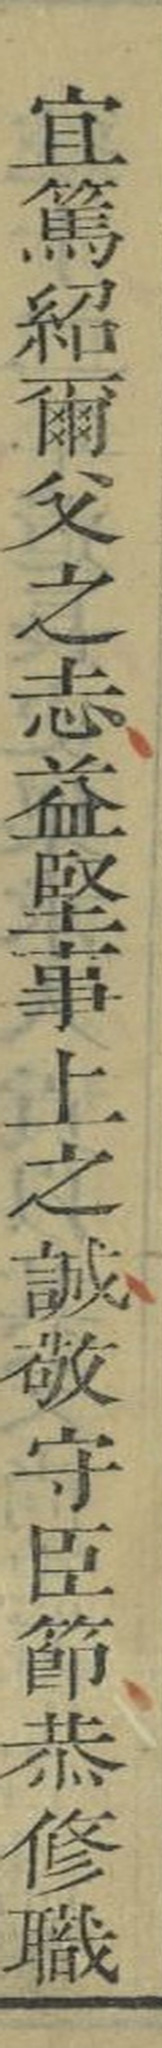宜篤紹爾父之志益堅事上之誠敬守臣節恭修職
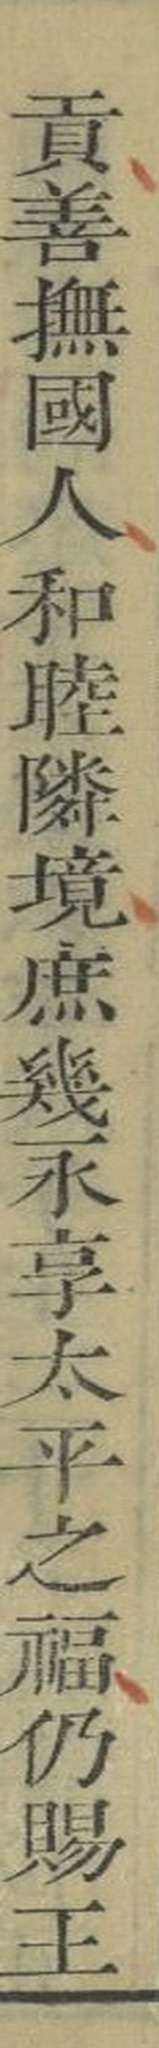貢善撫国人和睦隣境庶幾永享太平之福仍賜王
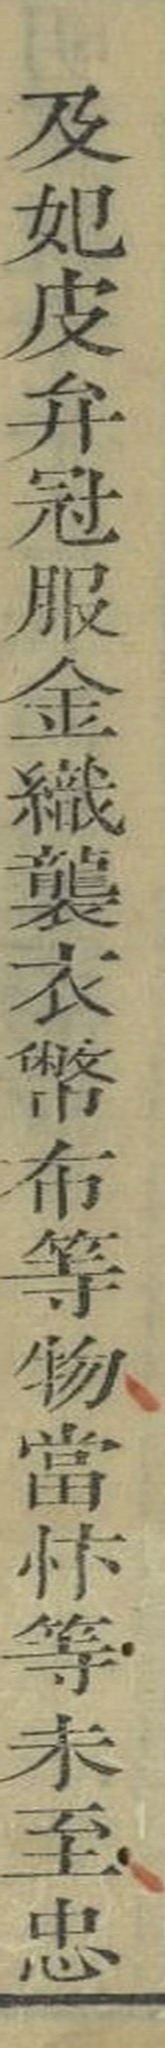及妃皮弁冠服金織襲衣幣布等物当忭等未至忠
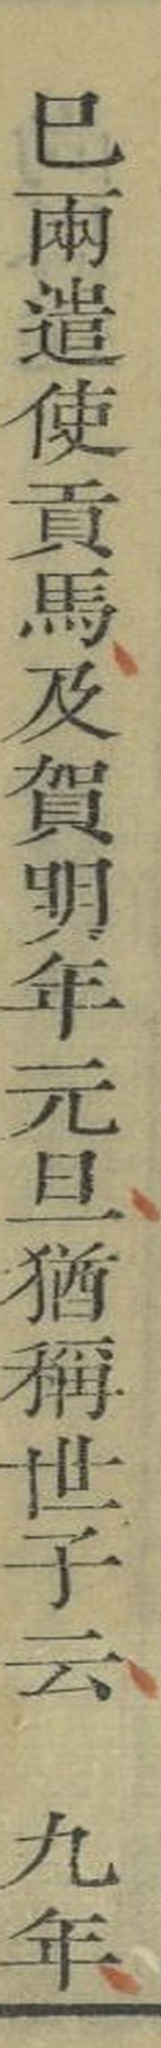巳両遣使貢馬及賀明年元旦猶称世子云九年
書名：中山伝信録 巻三
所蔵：University of the Ryukyus Library
